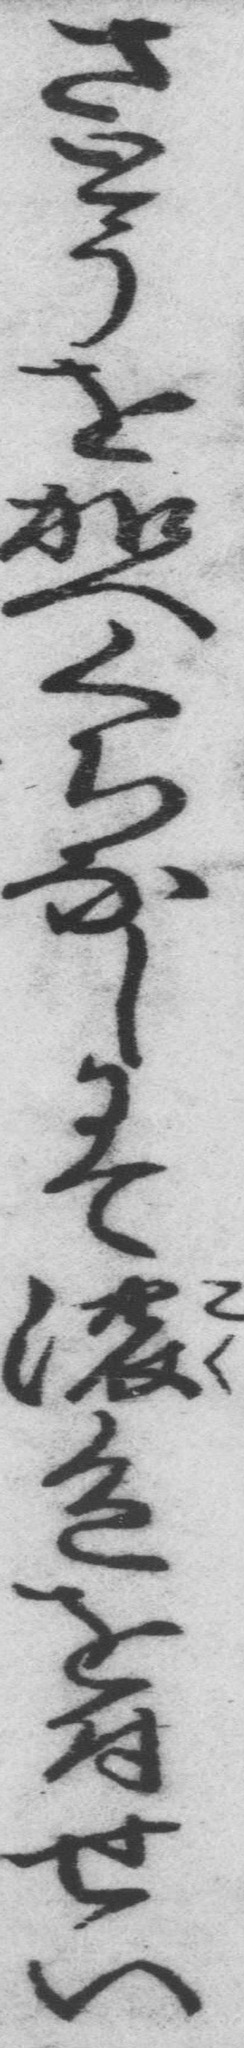さとうを加へくちなしにて濃色を付せい
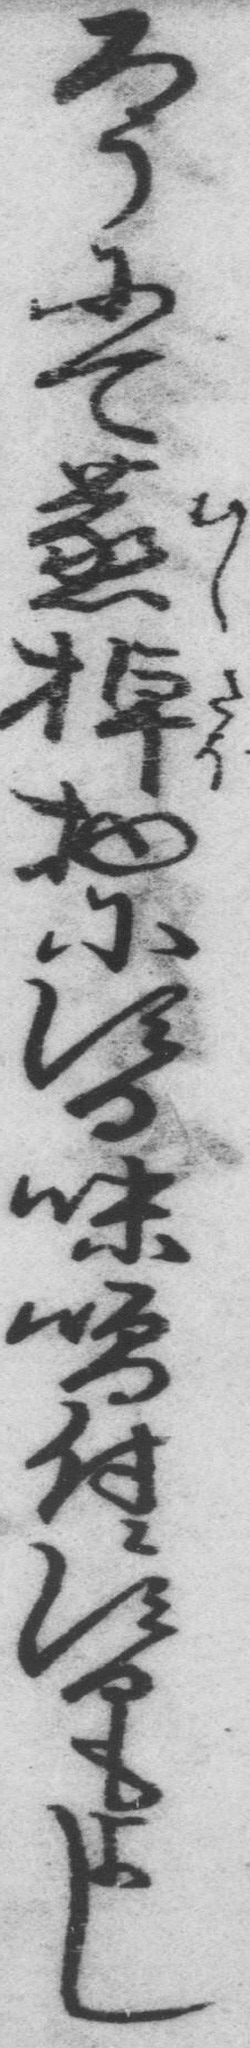ろうにて蒸棹物にする味噌付にするもよし
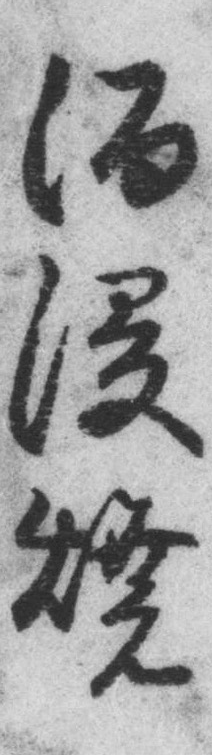酒浸焼
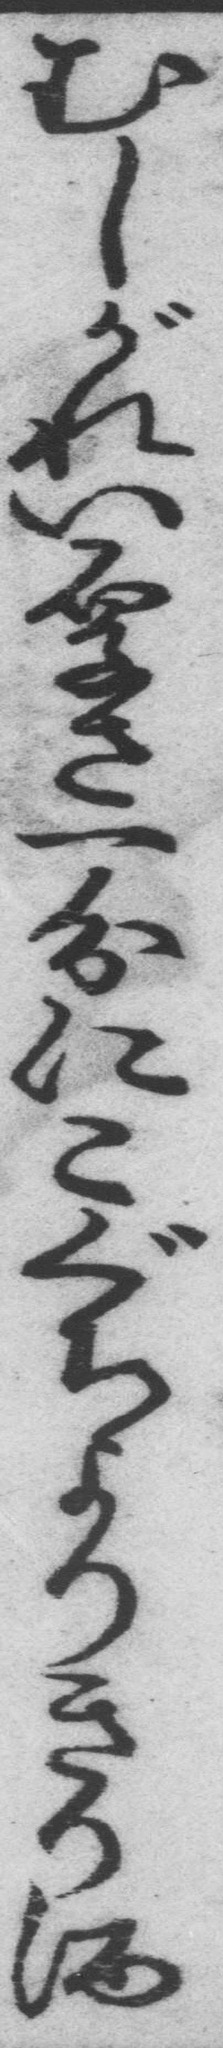むしがれい厚さ一分にこぐちよりきり酒
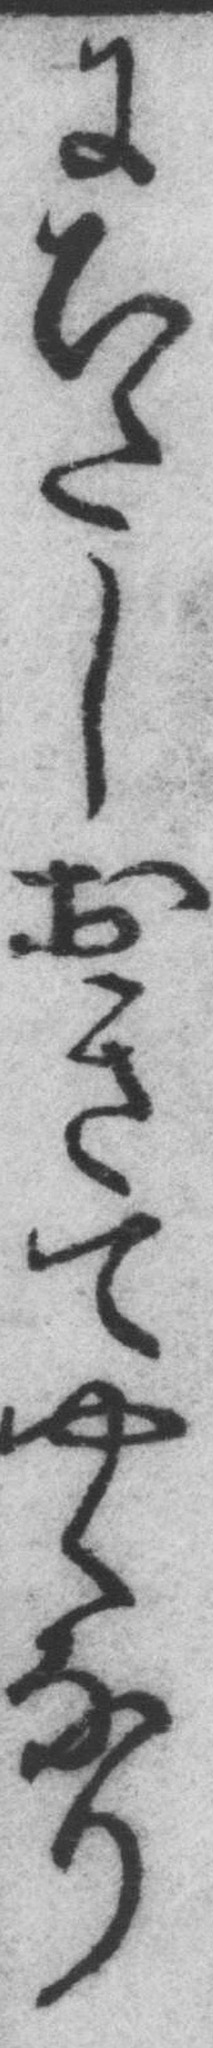にひたしおきてやくなり

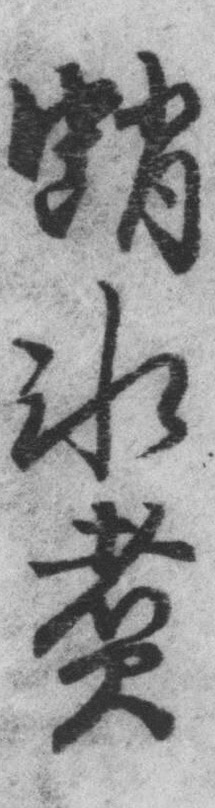蛸氷煮
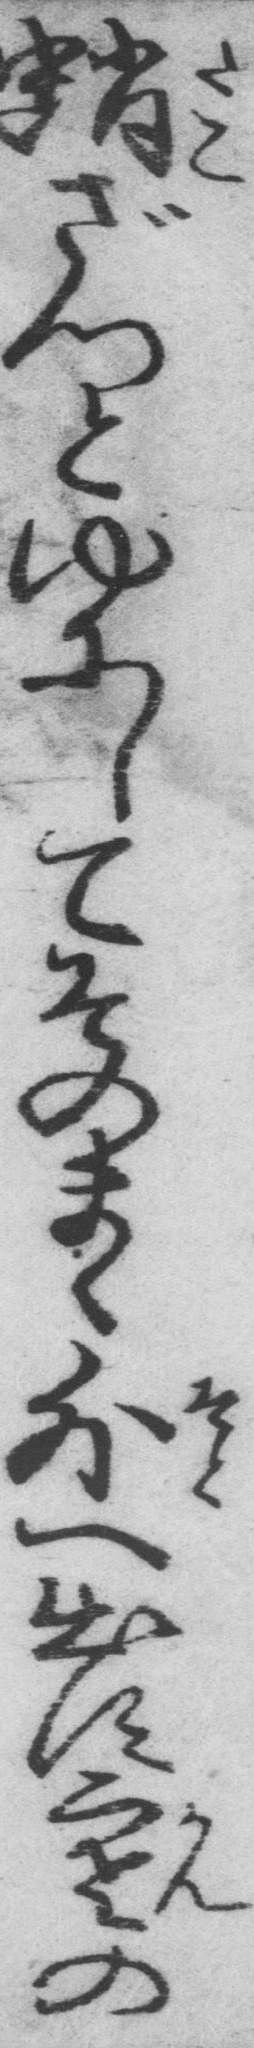蛸ざつとゆにしてそのまゝ外へ出す寒の
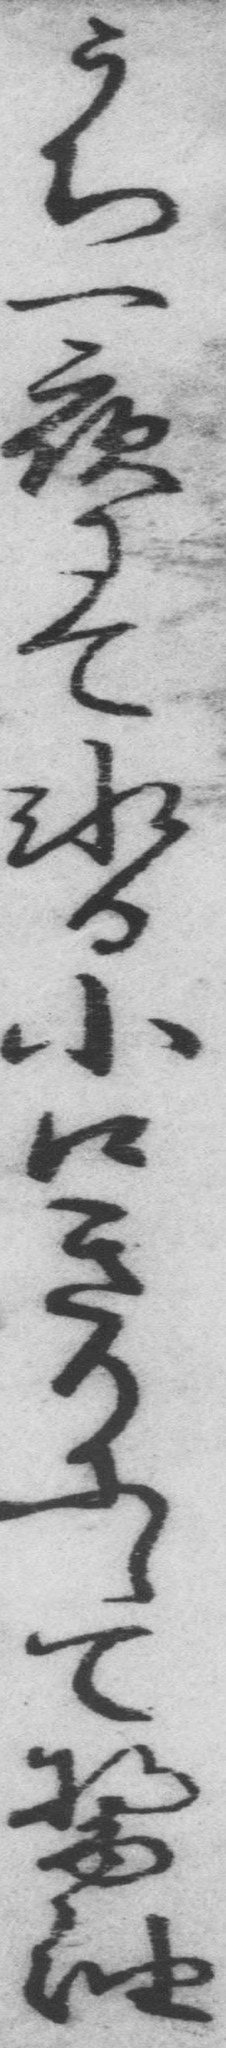うち一夜にて氷る小口きりにして醤油
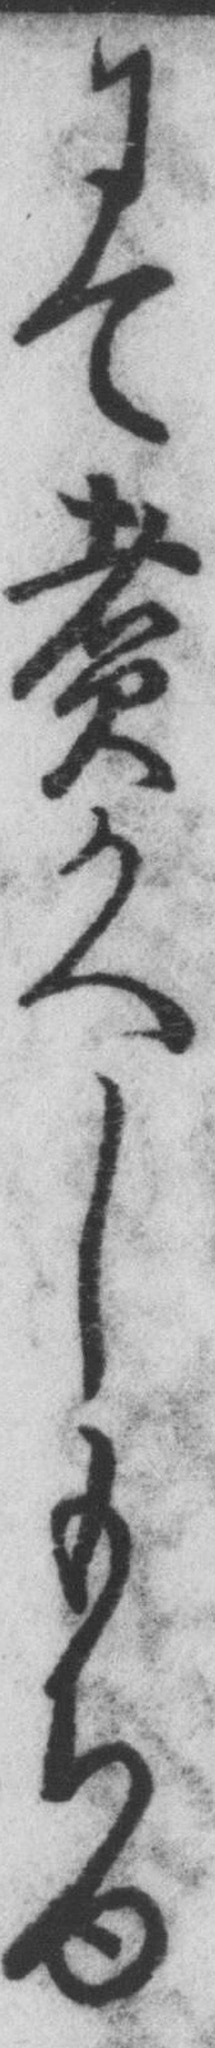にて煮かへしもちゆ
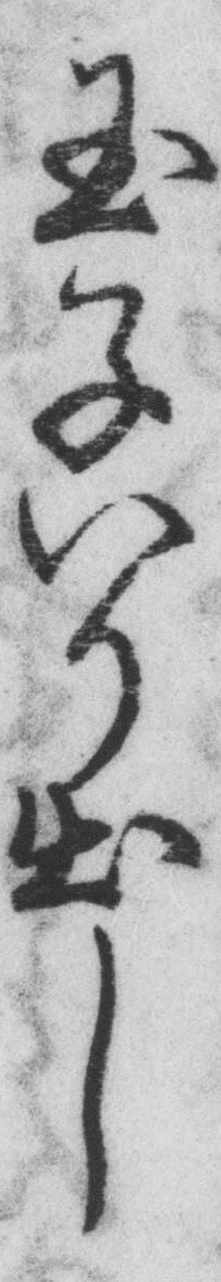玉子いり出し
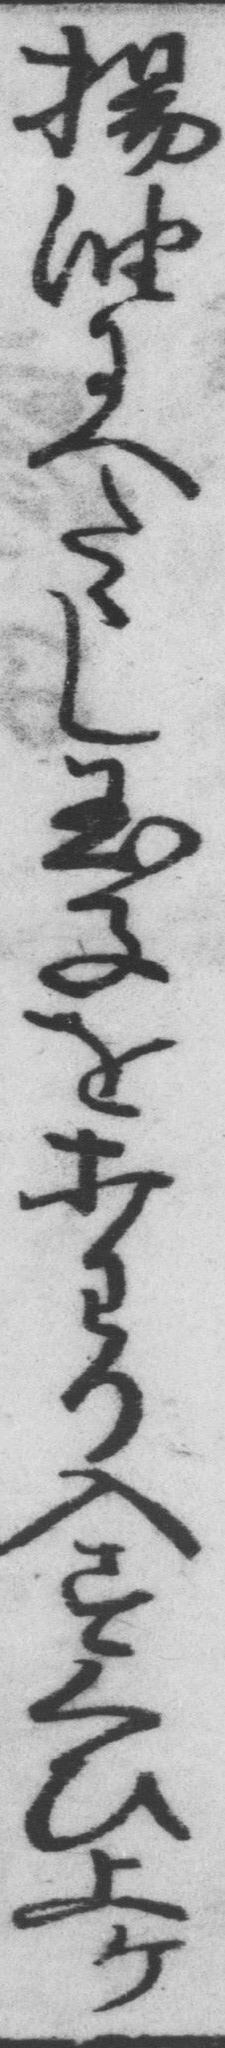揚油にへたゝし玉子を打わり入すくひ上け
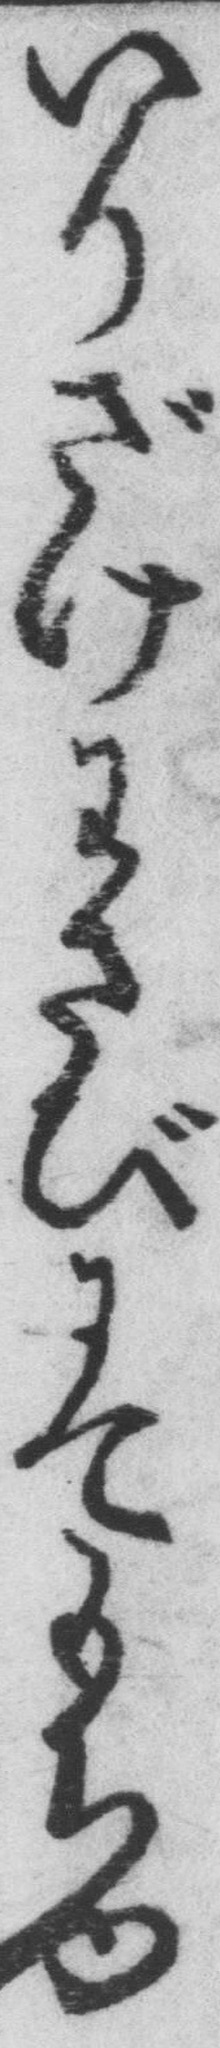いりざけわさびにてもちゆ
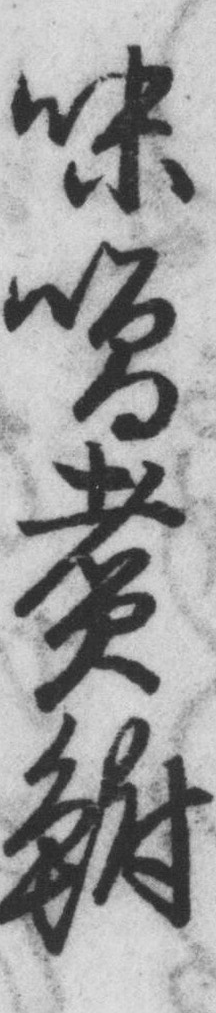味噌煮鮒
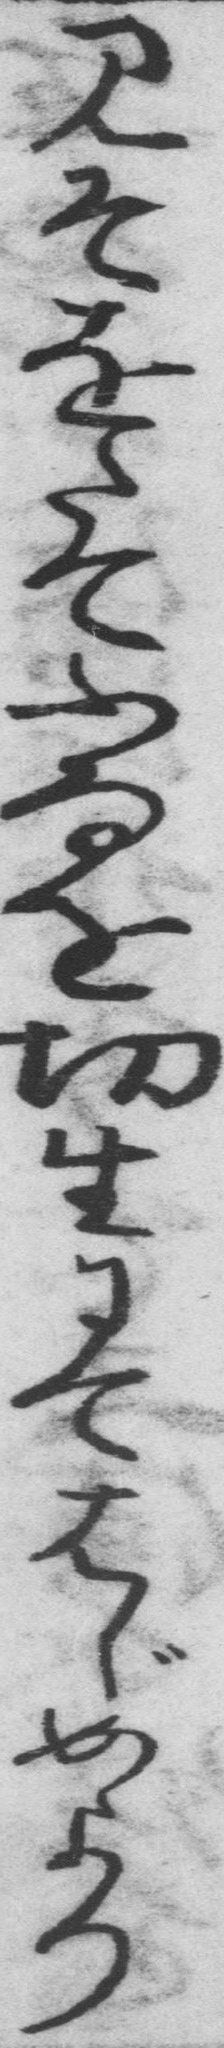みそをたてふなを切生にてはじめより
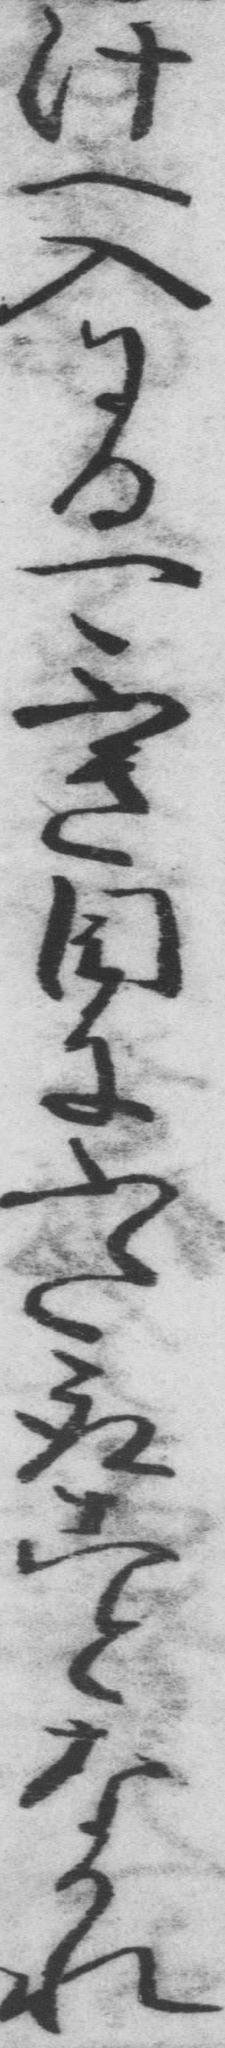汁へ入にる一ふき目にふた取ことなかれ
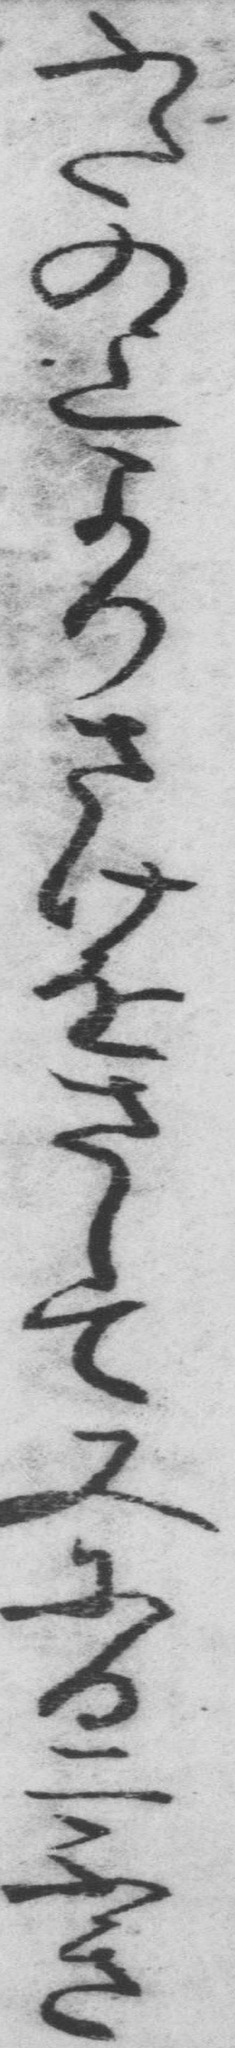ふらの上よりさけをさして又にる二ふき
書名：料理山海郷
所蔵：大阪府立大学学術情報センター 国文学研究資料館
